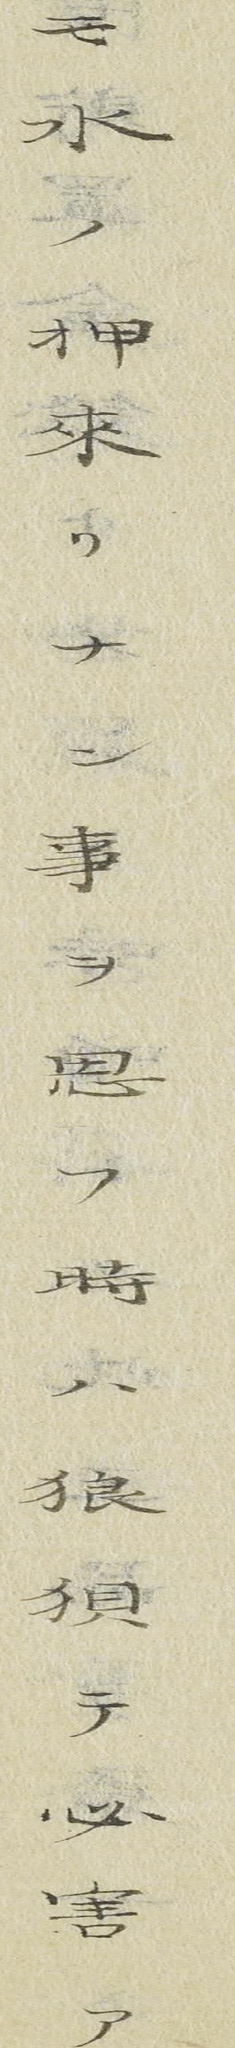モ水ノ押来リナン事ヲ思フ時ハ狼狽テ必害ア
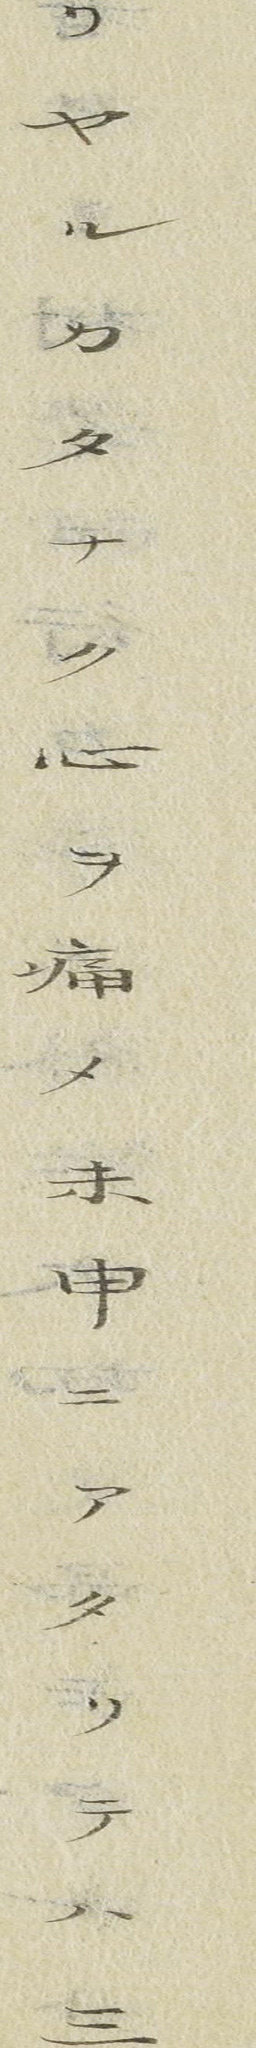リヤルカタナク心ヲ痛メ未申ニアタリテハ三
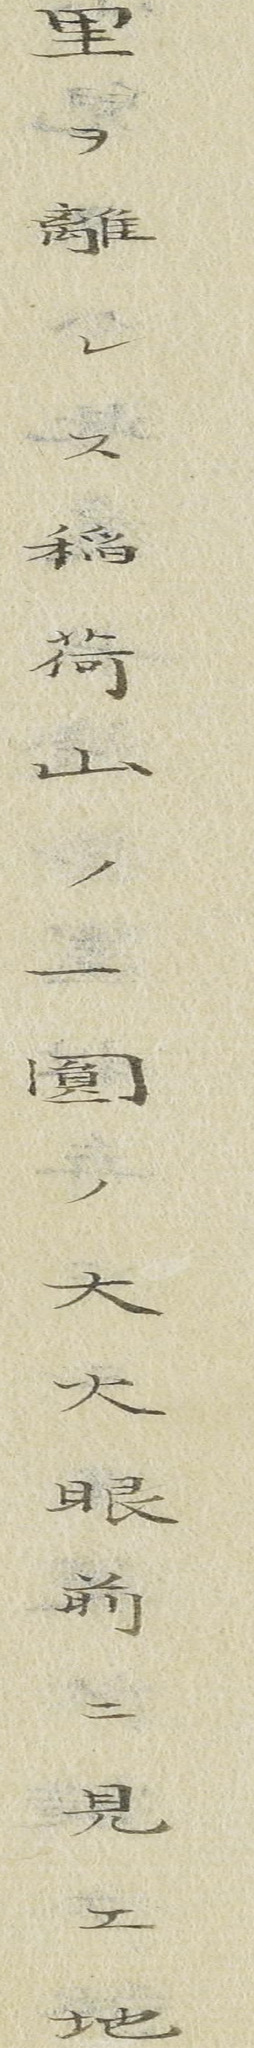里ヲ離レス稲荷山ノ一円ノ大火眼前ニ見エ地
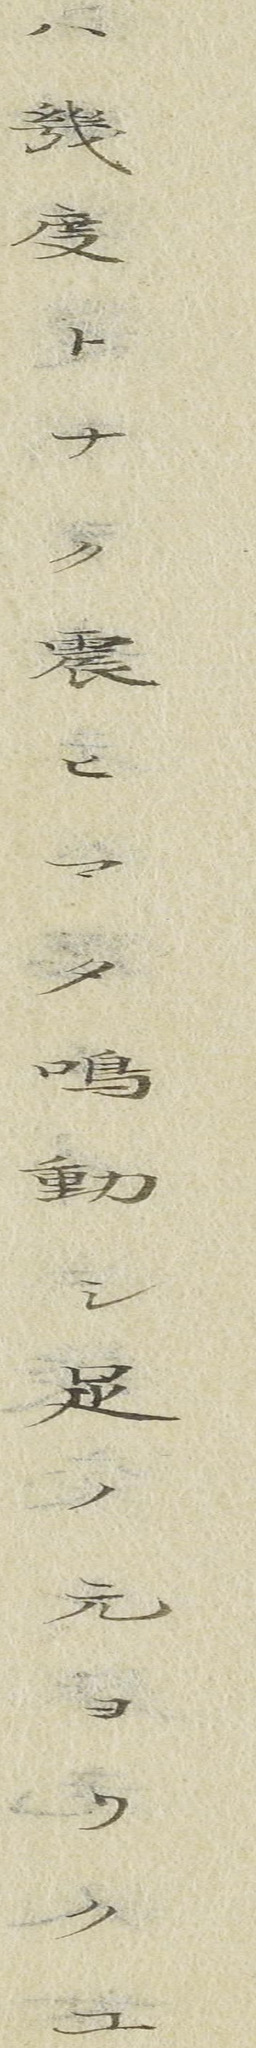ハ幾度トナク震ヒマタ鳴動シ足ノ元ヨリクユ
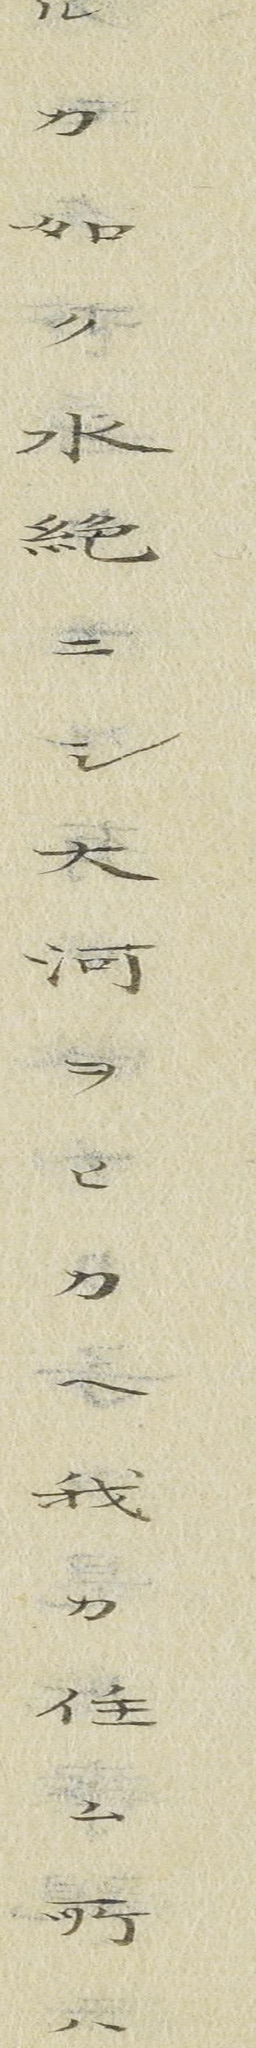ルカ如ク水絶ニシ大河ヲヒカヘ我カ住ム所ハ
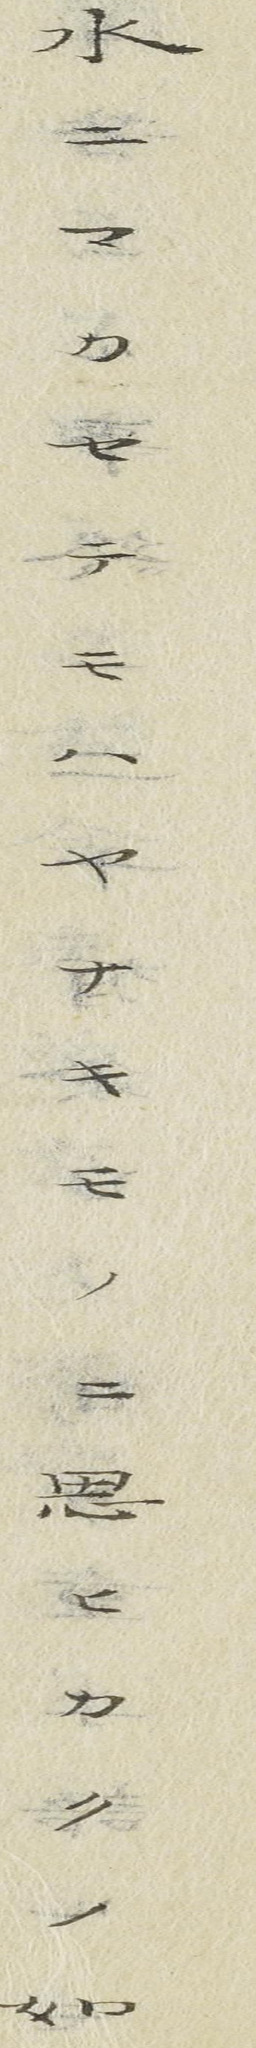水ニマカセテモハヤナキモノニ思ヒカクノ如
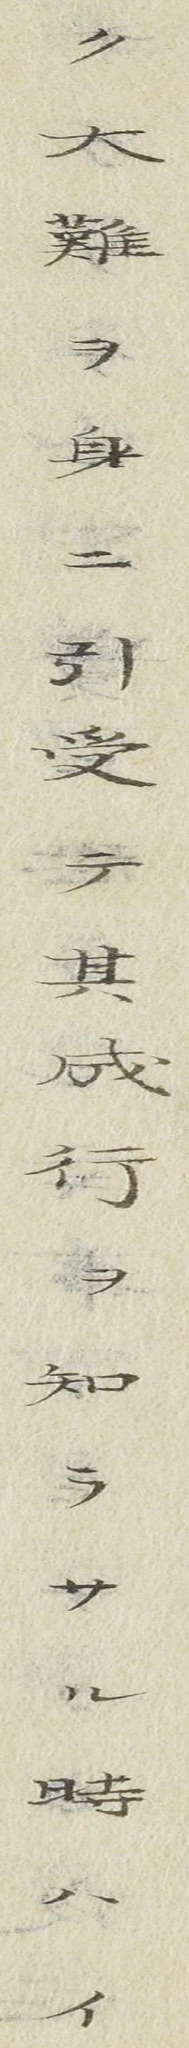ク大難ヲ身ニ引受テ其成行ヲ知ラサル時ハイ
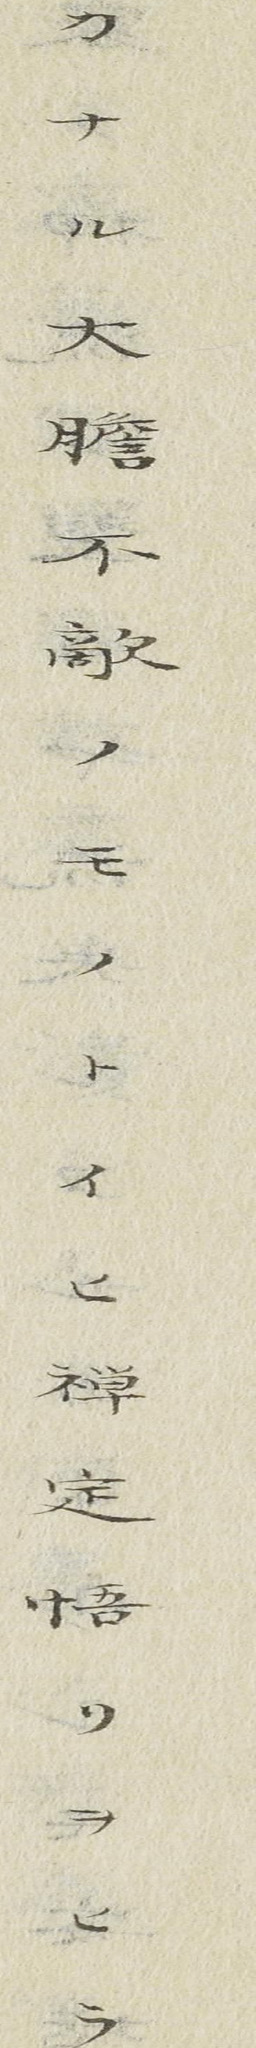カナル大膽不敵ノモノトイヒ禅定悟リヲヒラ
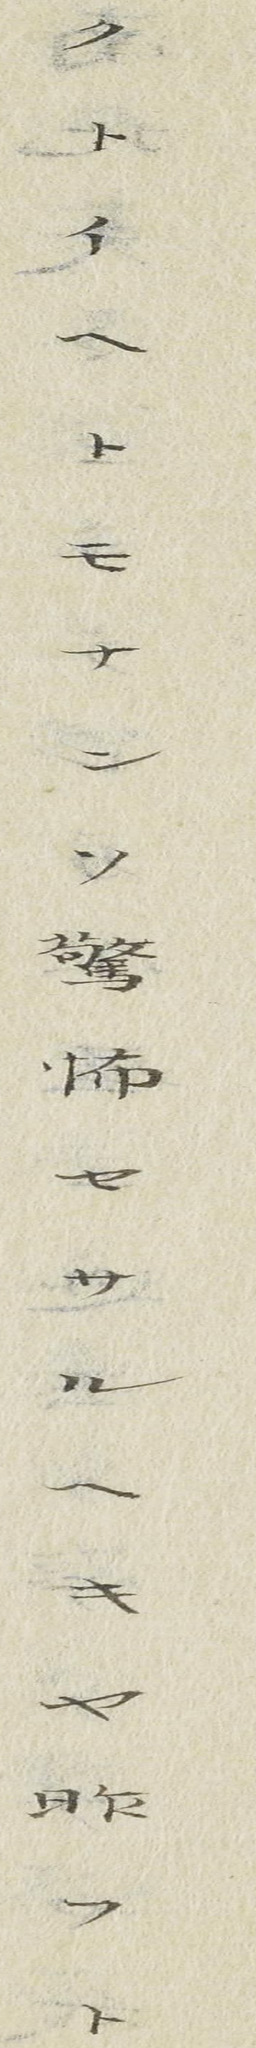クトイヘトモナンソ驚怖セサルヘキヤ昨フト
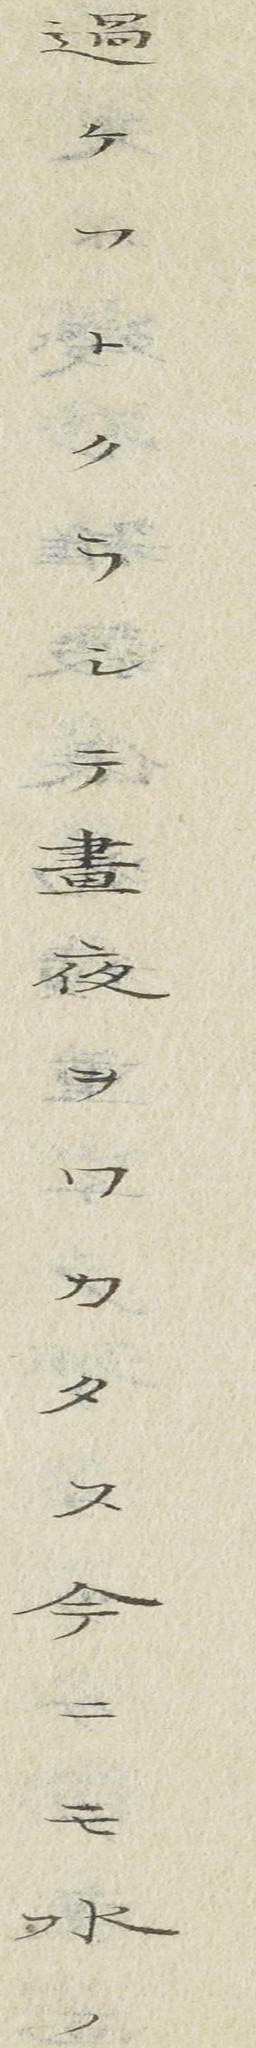過ケフトクラシテ昼夜ヲワカタス今ニモ水ノ
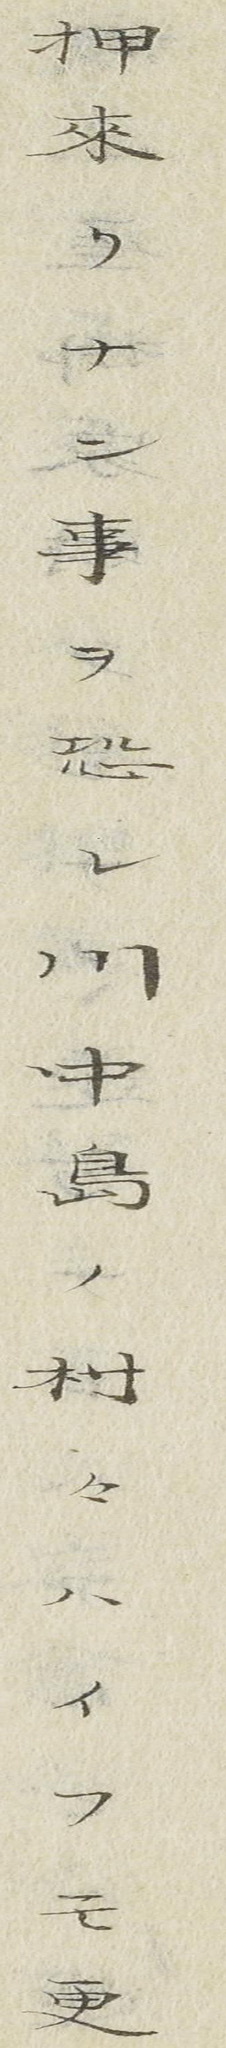押来リナン事ヲ恐レ川中島ノ村々ハイフモ更
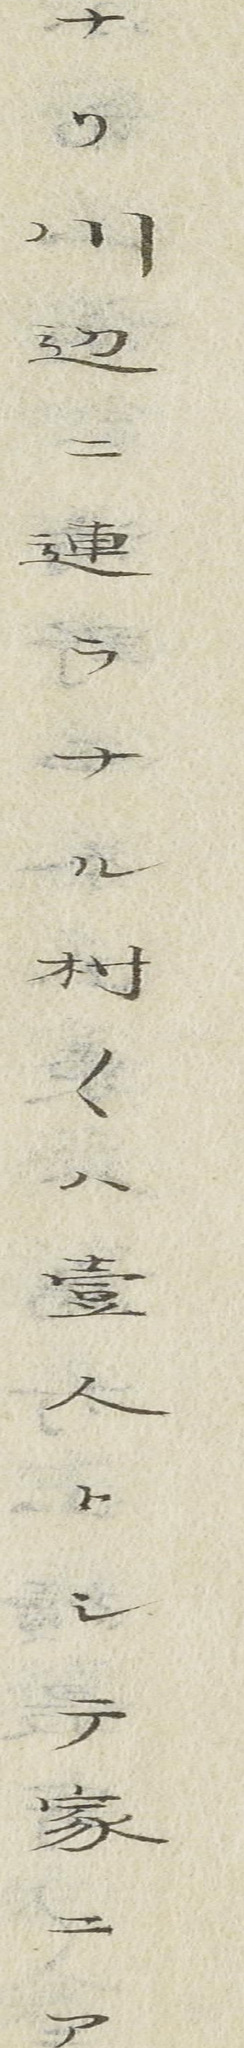ナリ川辺ニ連ラナル村〱ハ一人トシテ家ニア
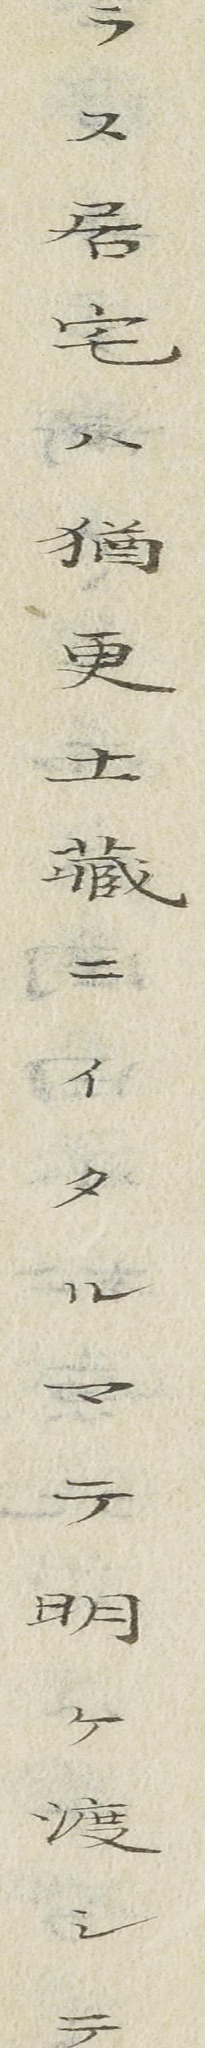ラス居宅ハ猶更土蔵ニイタルマテ明ケ渡シテ
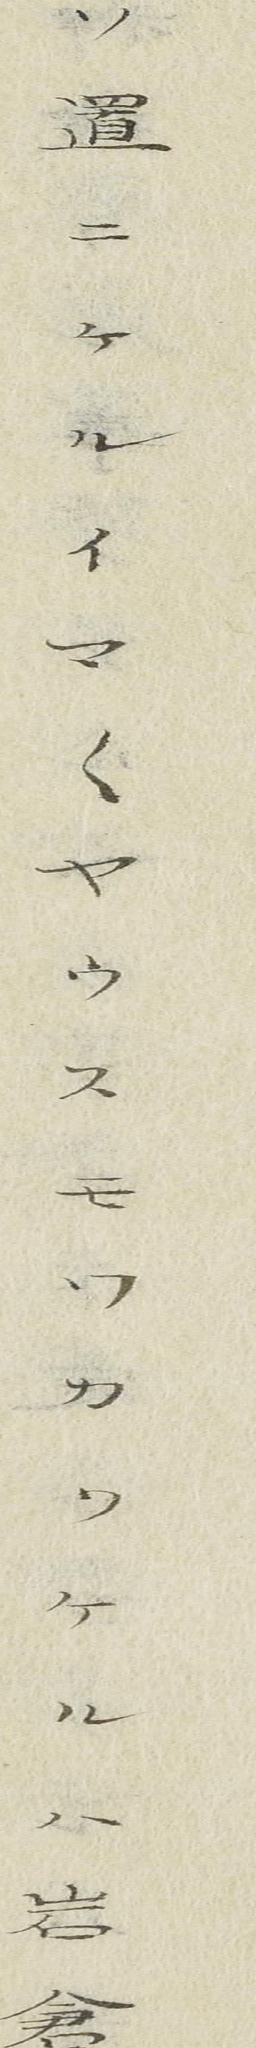ソ置ニケルイマ〱ヤウスモワカリケルハ岩倉
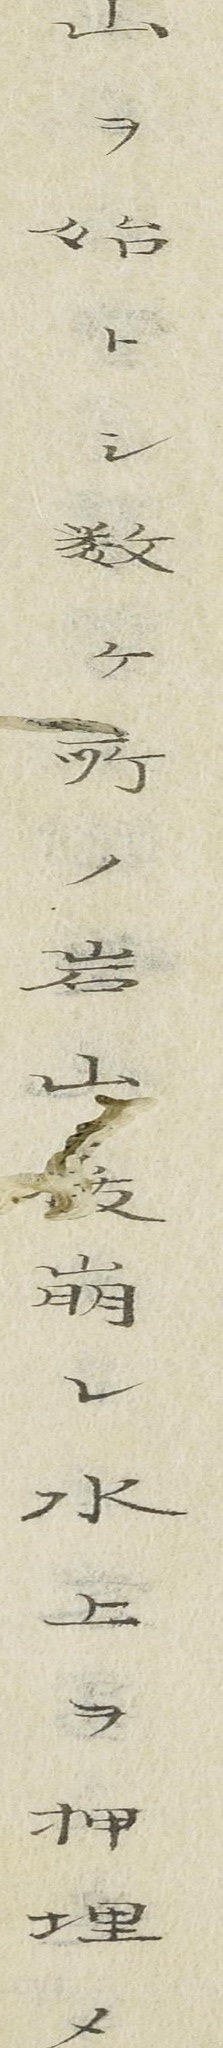山ヲ始トシ数ケ所ノ岩山抜崩レ水上ヲ押埋メ

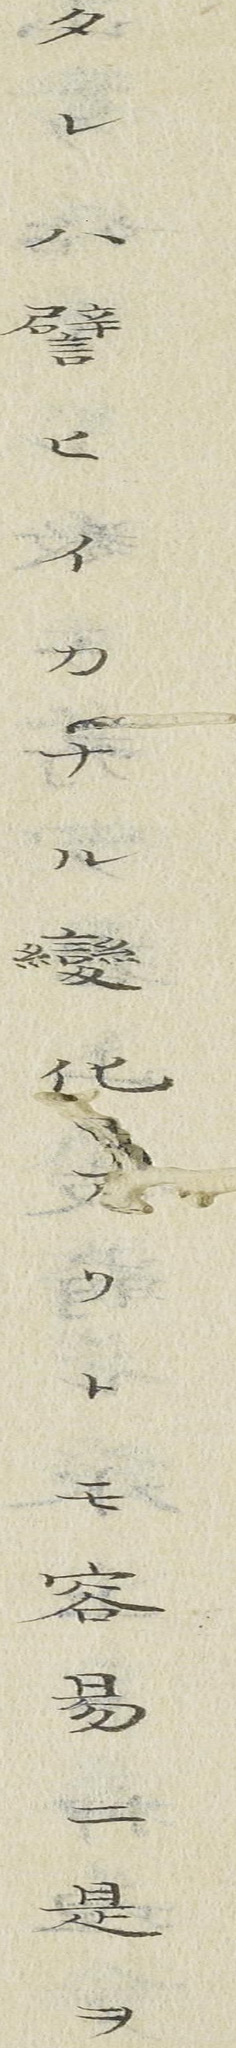タレハ譬ヒイカナル変化ナリトモ容易ニ是ヲ
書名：地災撮要　地震之部　巻ノ二
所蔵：東京大学地震研究所図書室 Earthquake Research Institute Library, The University of Tokyo, JAPAN
